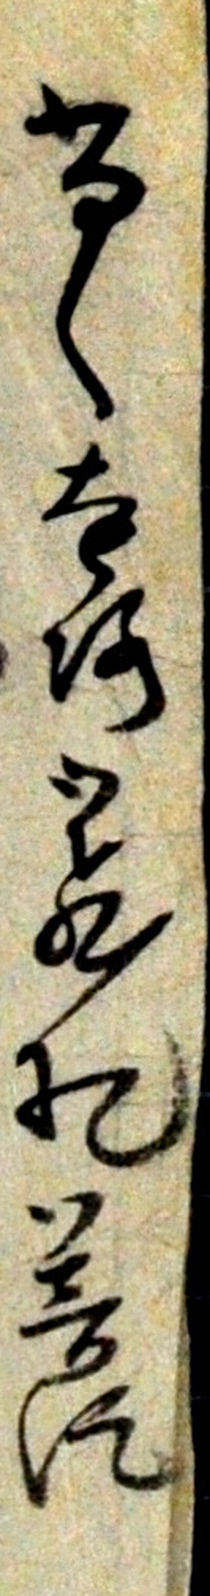尚々遠路御飛札御音信
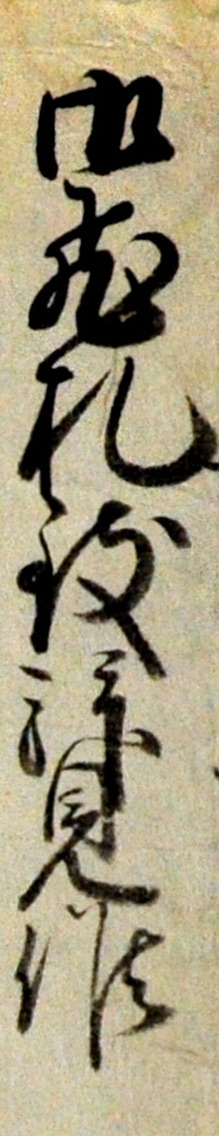御飛札致拝見候
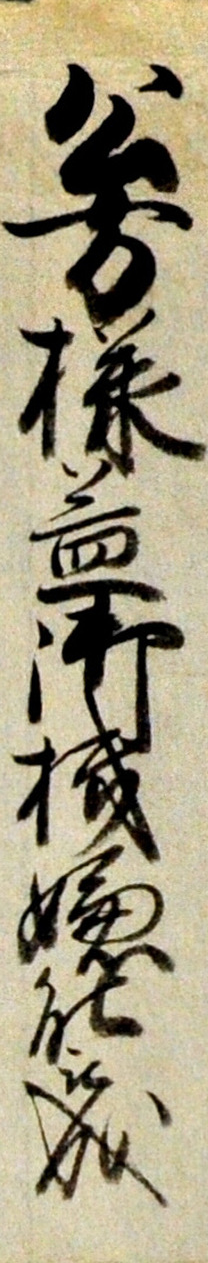公方様益御機嫌能被成
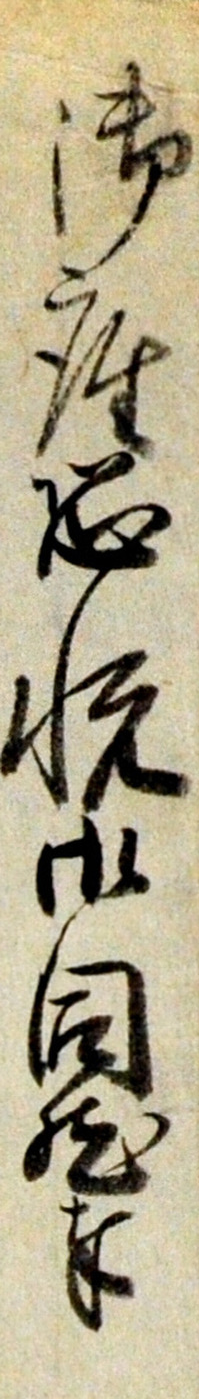御座恐悦御同然奉
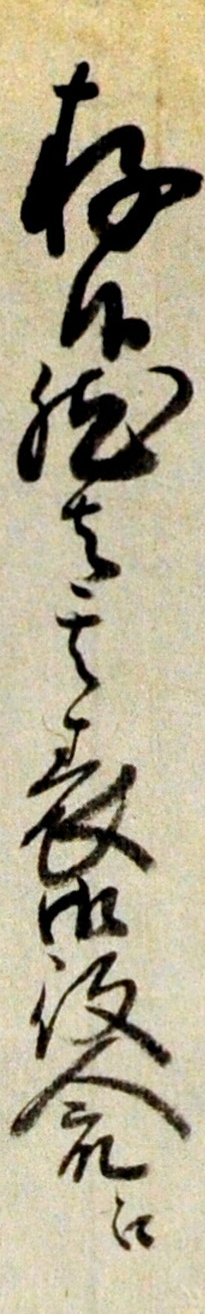存候然者其表御役人衆江
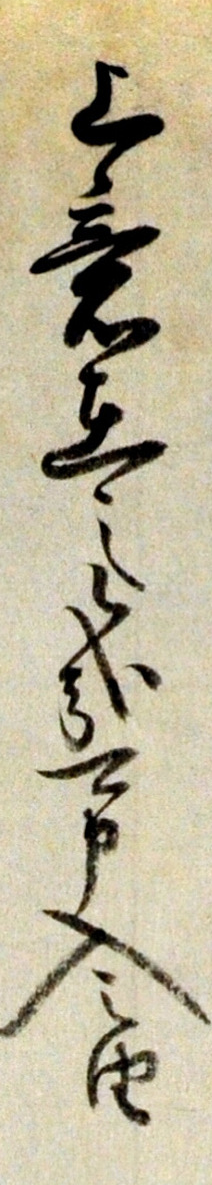上意在之候哉可申入之由
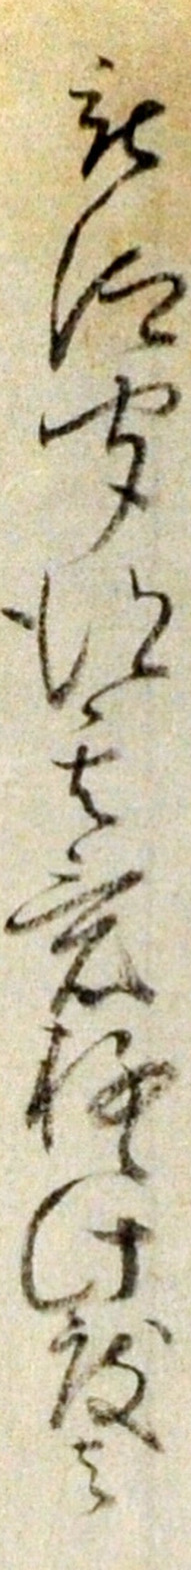被仰聞得其意存候此度者
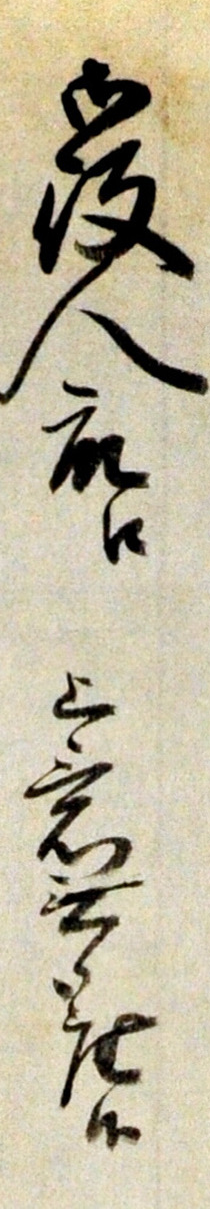御役人衆江上意無御座候
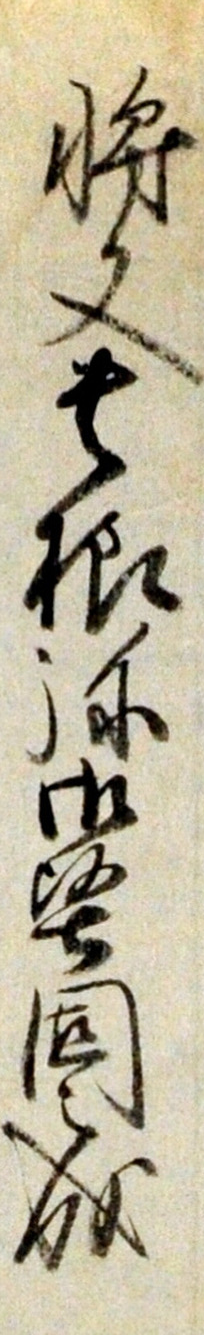将又貴様弥御堅固被成
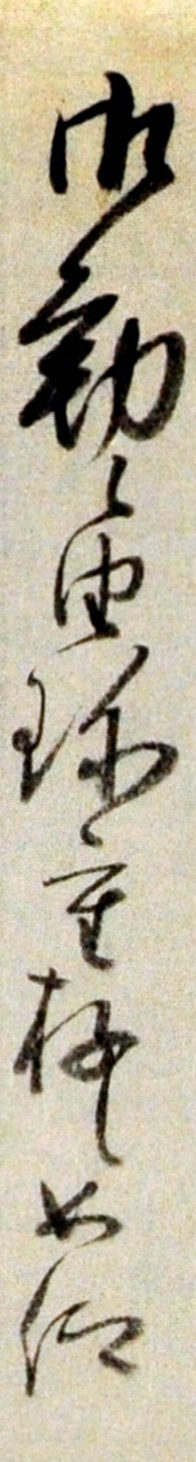御勤候由珎重存候如仰
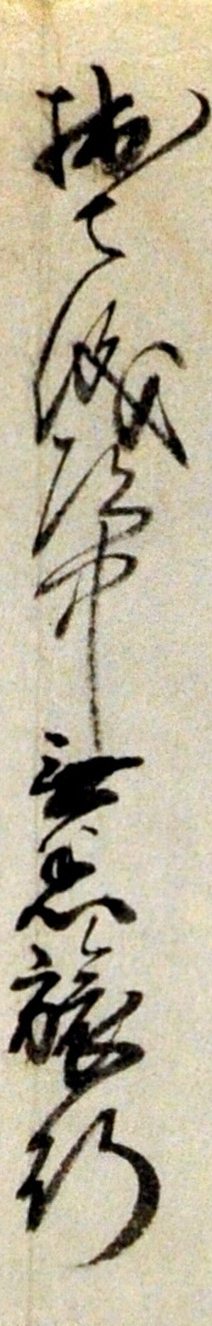拙者儀道中無恙旅行
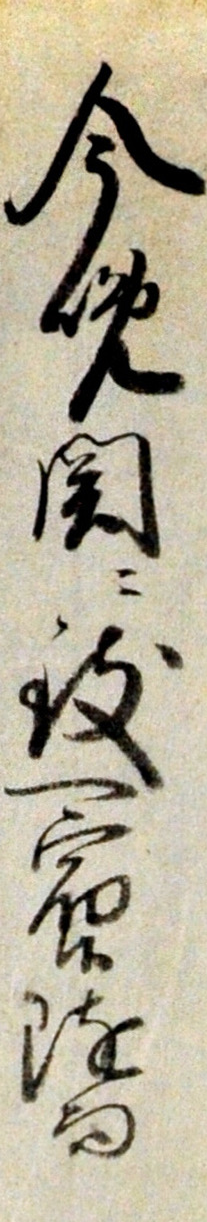今晩関ニ致一宿候随而
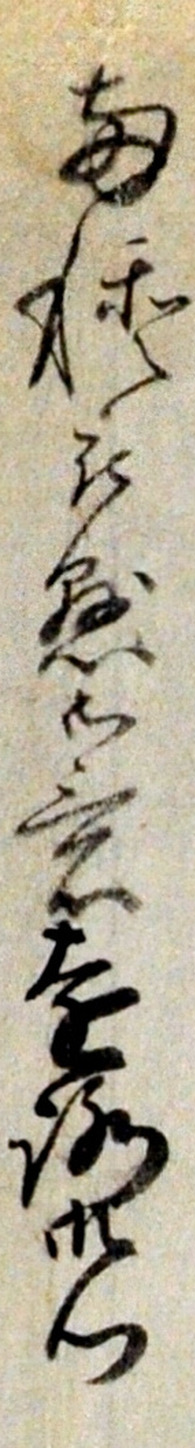両被懸御意遠路御心
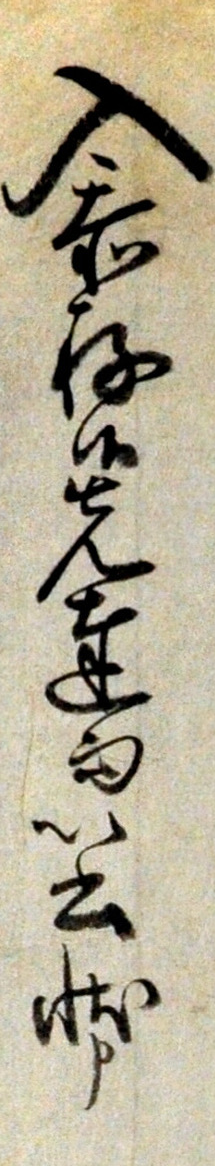入忝存候先達而以書状申
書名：書状
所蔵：伊那市立高遠町図書館・合同会社AMANE
